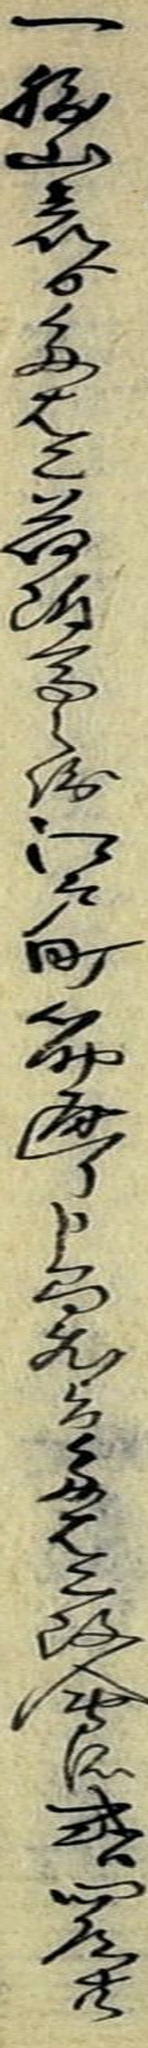一勝山表ゟたはこ荷付馬之儀江戸町筋通り申間敷旨たはこ改会所或ハ問屋共
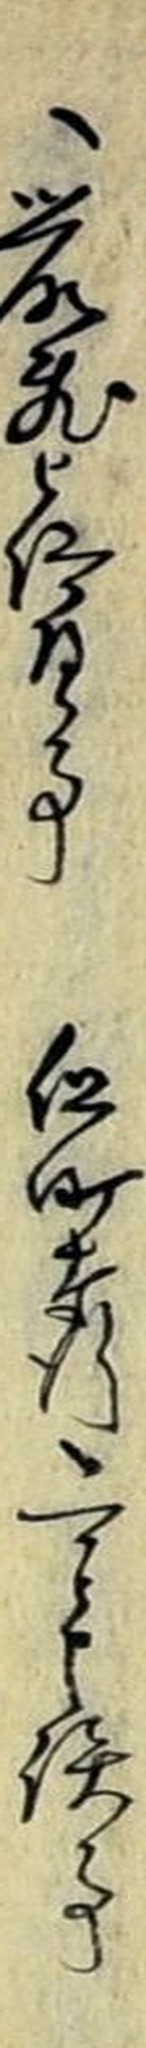へ厳敷被仰付候事但町奉行へ可被申談事
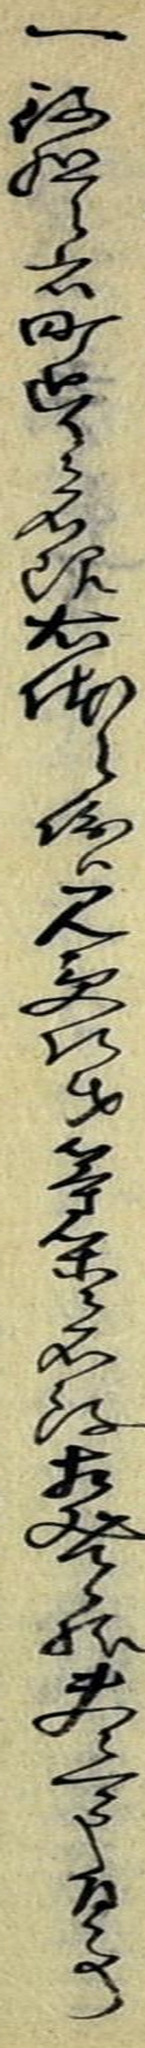一役組之者町廻りニ不限右体之儀ハ見受次第等閑ニ不致相咎候様夫々可申付事
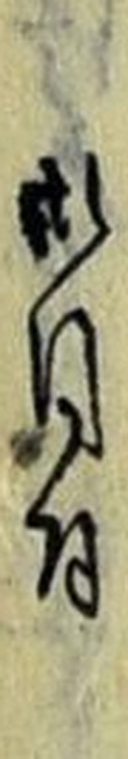御目付
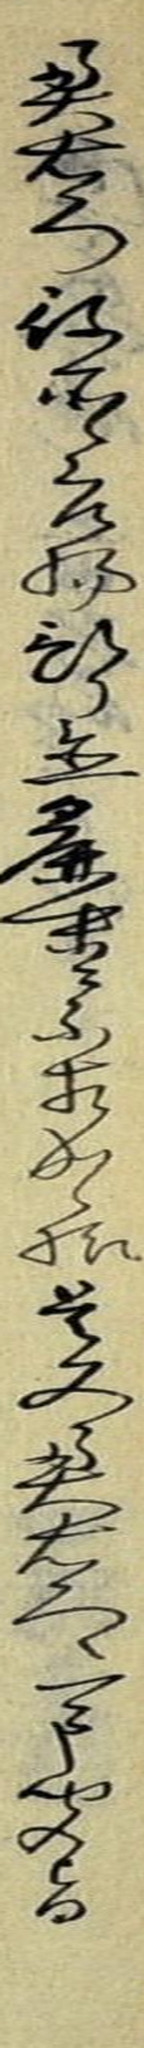奥右衛門役所へ取揚預り置麁末ニ不相成候様是又奥右衛門へ可申聞旨
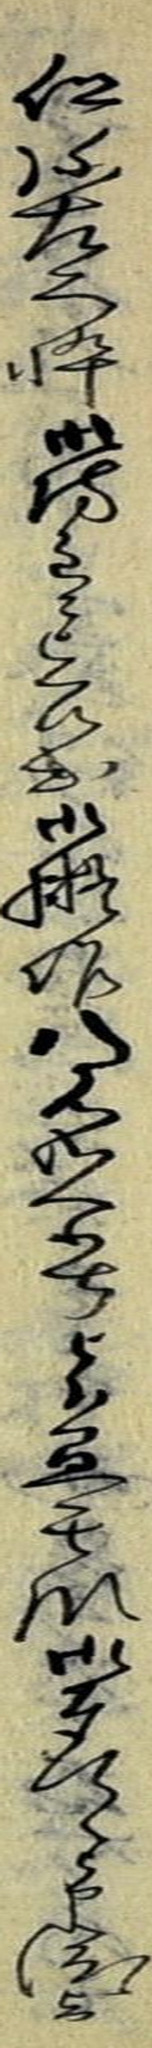但弥左衛門忰御坊主ニ被召出御擬作八石弐人ふち被下置其段御奉行へ被申渡候旨
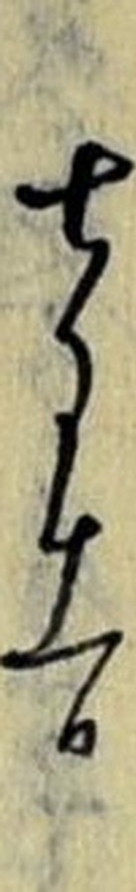七月十一日
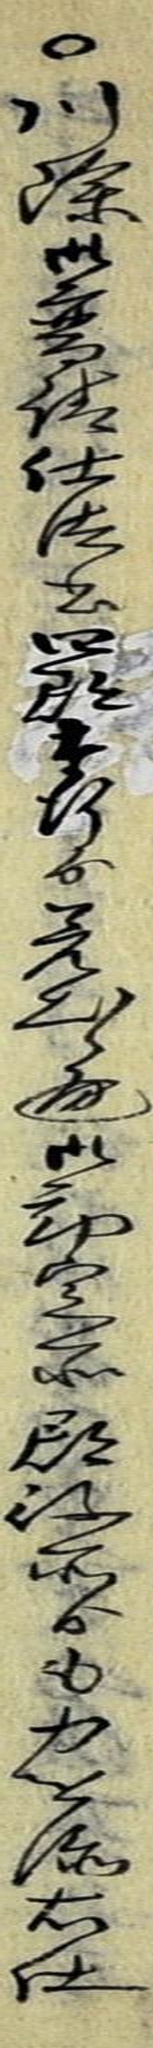〇川除御普請仕法書四郡奉行ゟ差出候通御勘定所郡役所ゟも力を添右仕
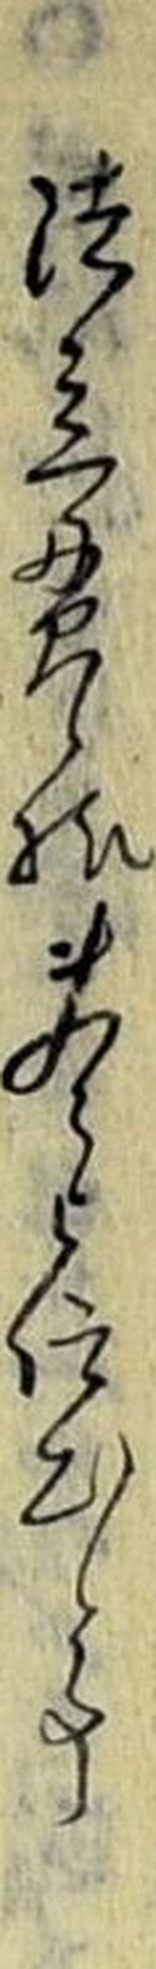法立貫候様夫々被仰出候事
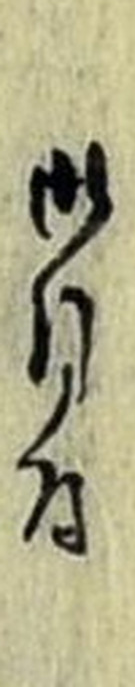御目付
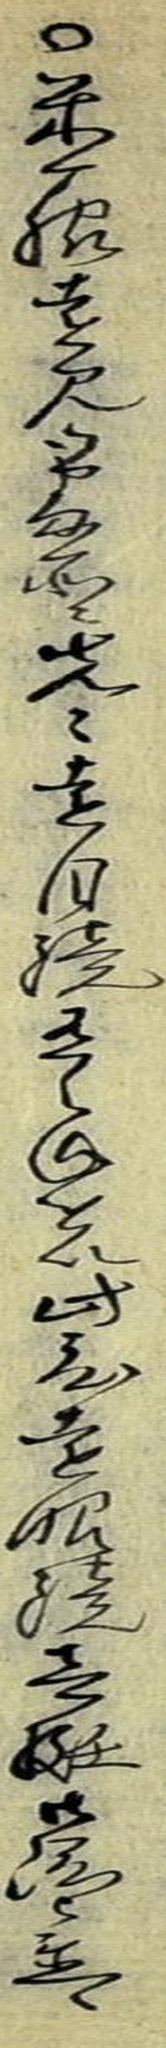〇米ケ脇遠見御番所ニ先々遠目鏡有之趣を以此度遠眼鏡壱挺御渡被置候
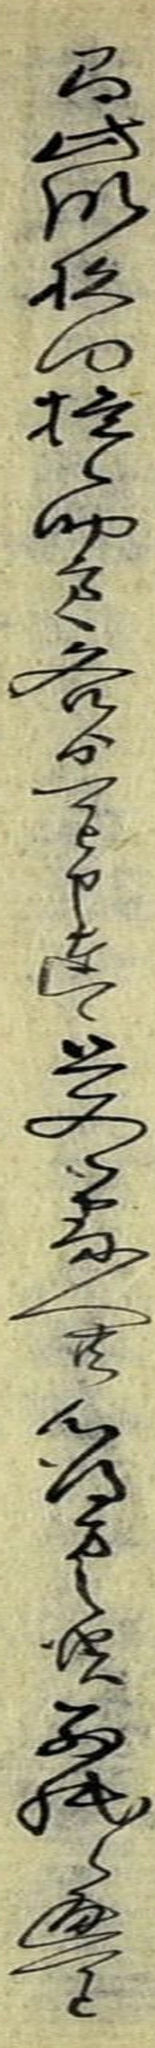間此段杉田権之助方へ各ゟ可被申達候且又御番人共心得方之儀ハ別紙之通可被
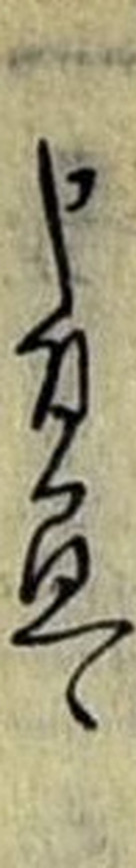申付置候
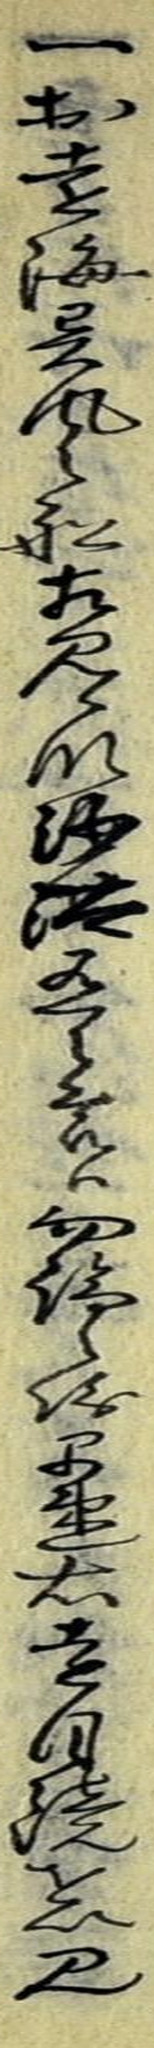一於遠海異風之船相見候段沙汰有之節ハ勿論之儀早速右遠目鏡を以見
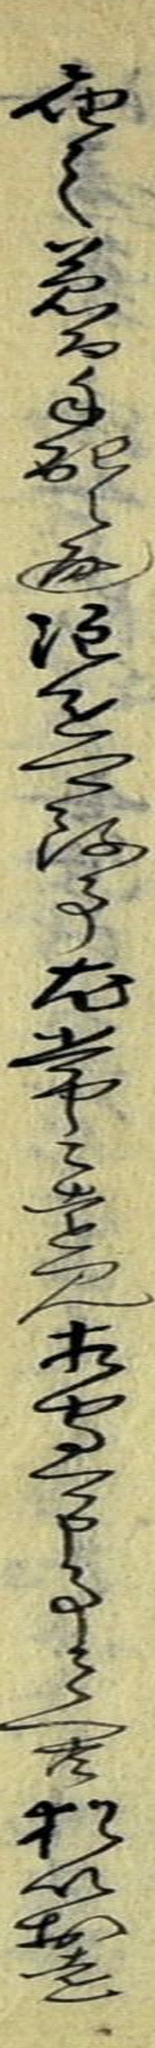届之兼而手配之通注進可致事尤常々遠見相守可申事ニ候へ共猶以於遠

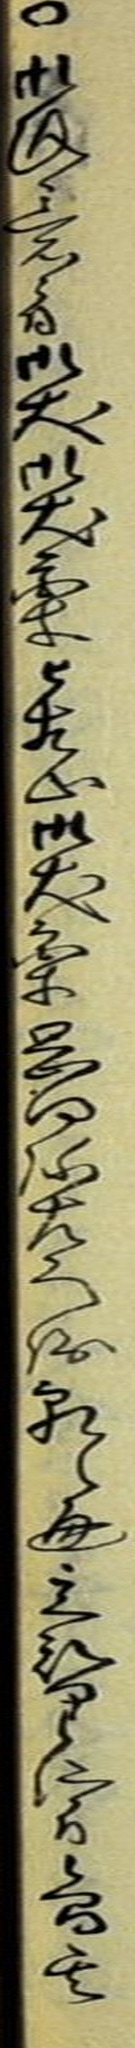〇御趣意ニ付御犬御犬牽被相止御犬牽岡田弥左衛門儀願之通立替被仰付候間其
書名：命令之部 三
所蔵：福井県文書館 Fukui Prefectural Archives
